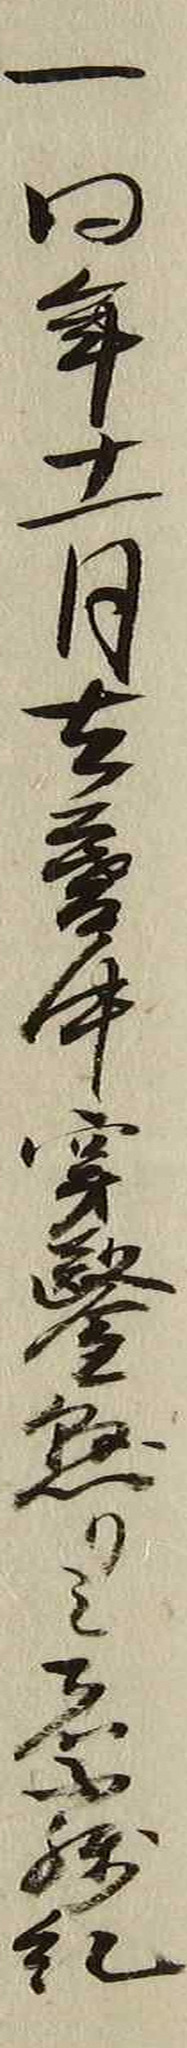一同年十一月去暮中穿鑿懸り之者不残糺
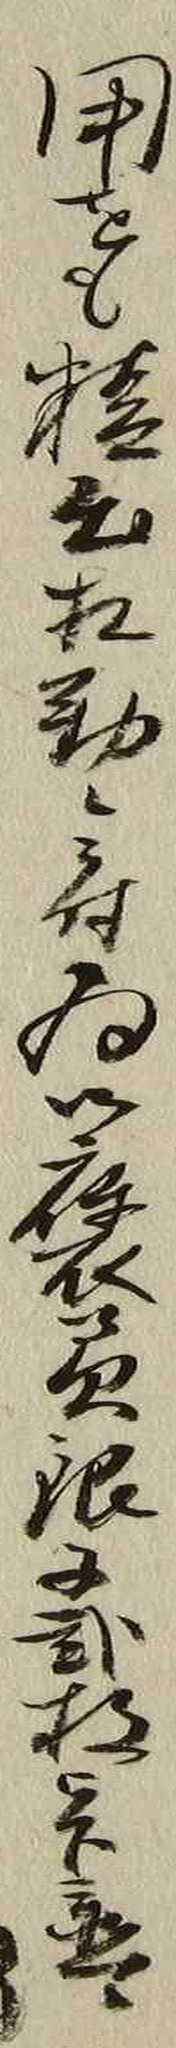用をも精出相勤候付為御褒美銀子弐枚被下置候事
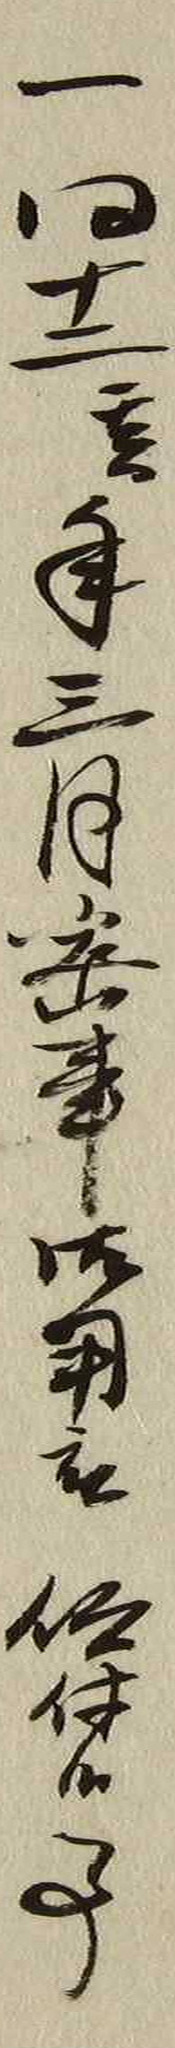一同十二亥年三月密事御用被仰付候事
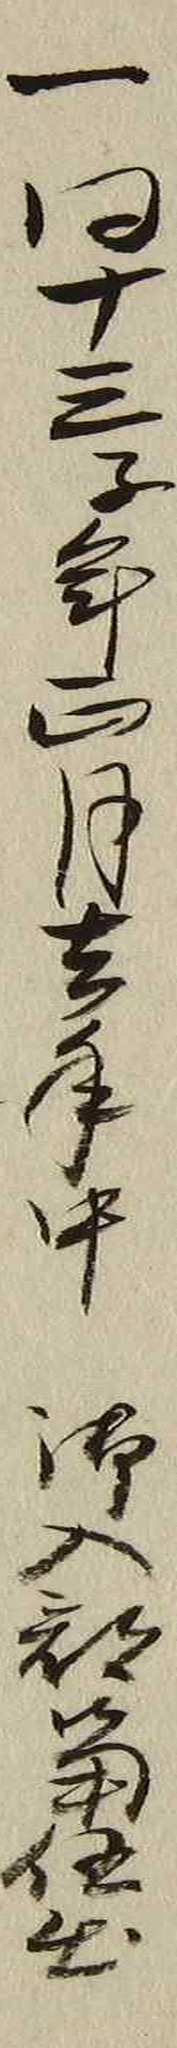一同十三子年正月去年中御入部御用任出
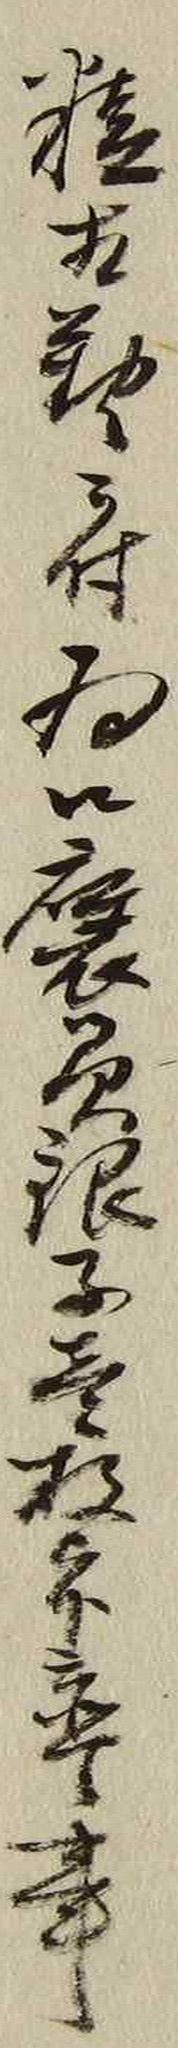精相勤候付為御褒美銀子壱枚被下置候事
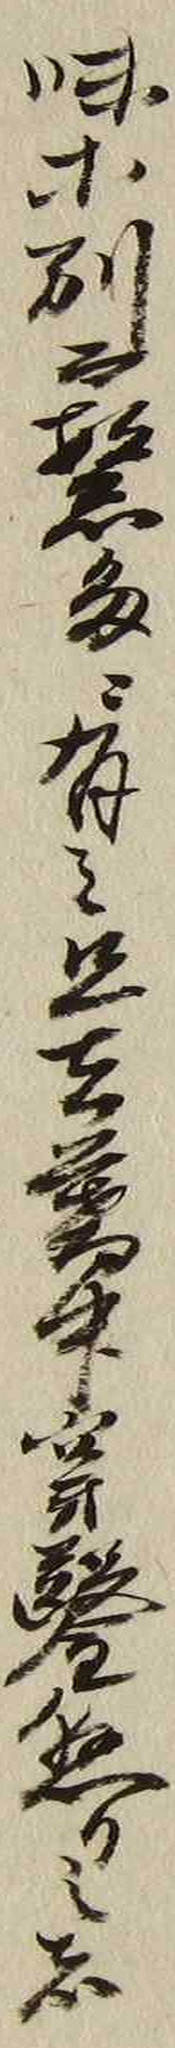味等別而繁多有之且去暮中穿鑿懸り之者
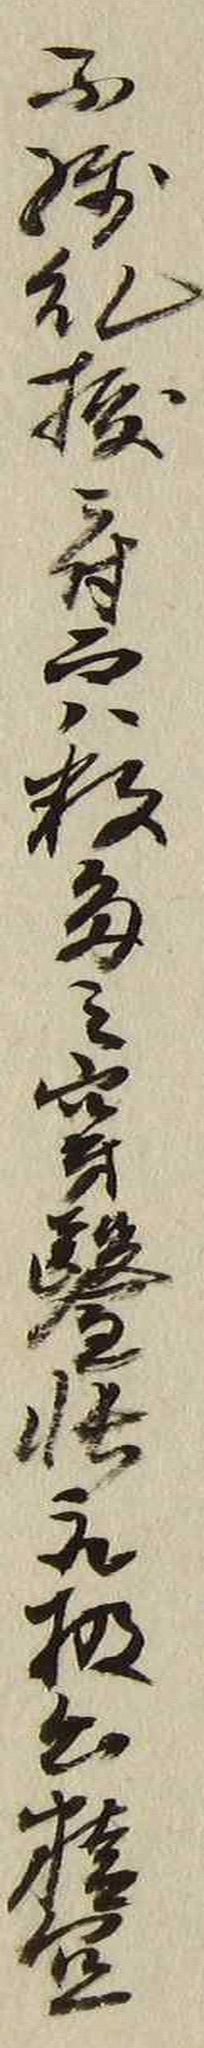不残糺抜付而ハ数多之穿鑿帳取扱出精宜
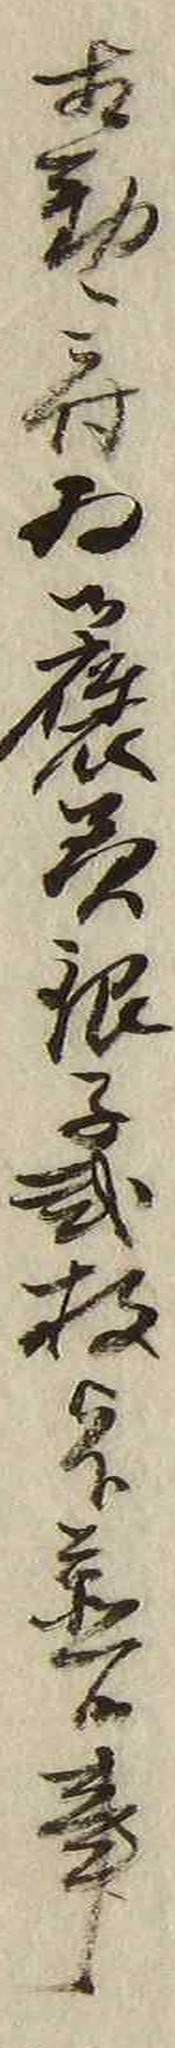相勤候付為御褒美銀子武枚被下置候事

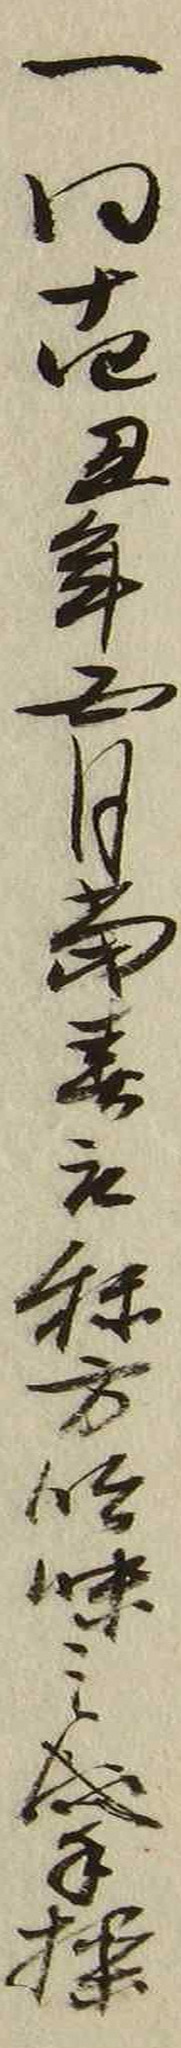一同十四丑年五月当春被称方吟味之義手操
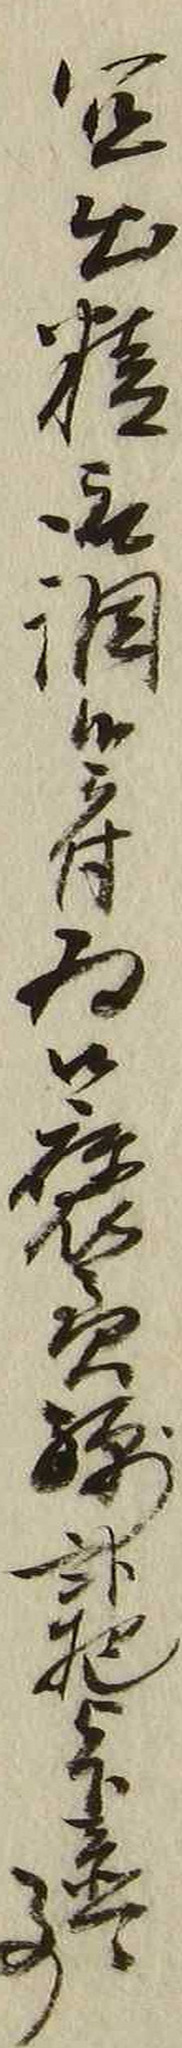宜出精取調被付為御褒美綿把被下置候事
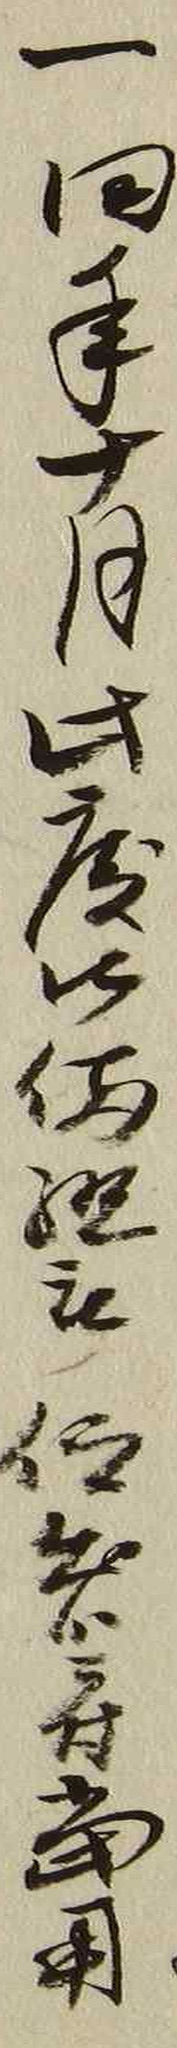一同年十月此度此御備組被仰出候付ニ当用
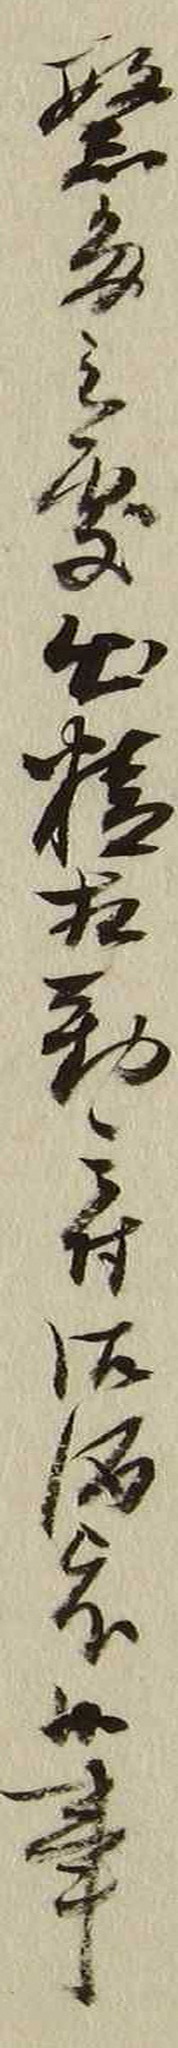繁多之処出精相勤候付御酒被下候事
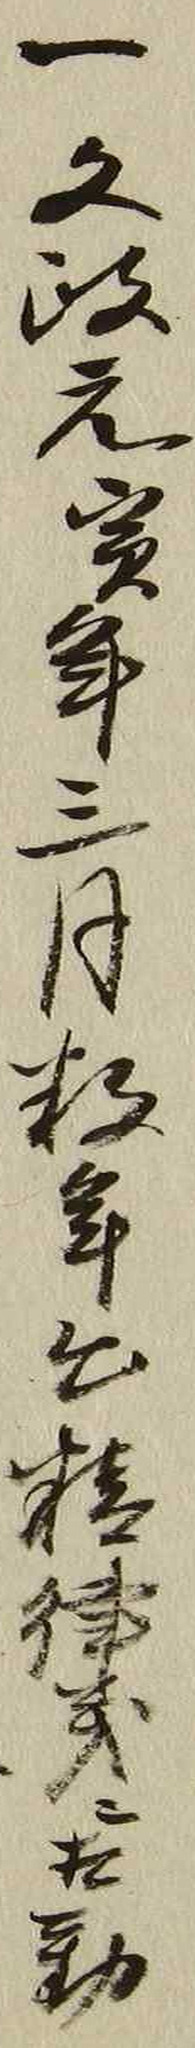一文政元寅年三月数年出精律義相勤
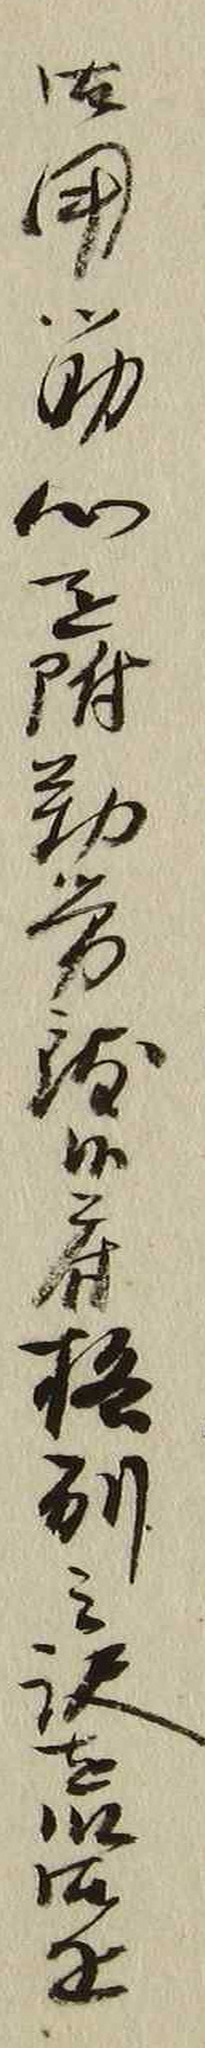御用筋心を附勤労致候付格別之訳を以御近
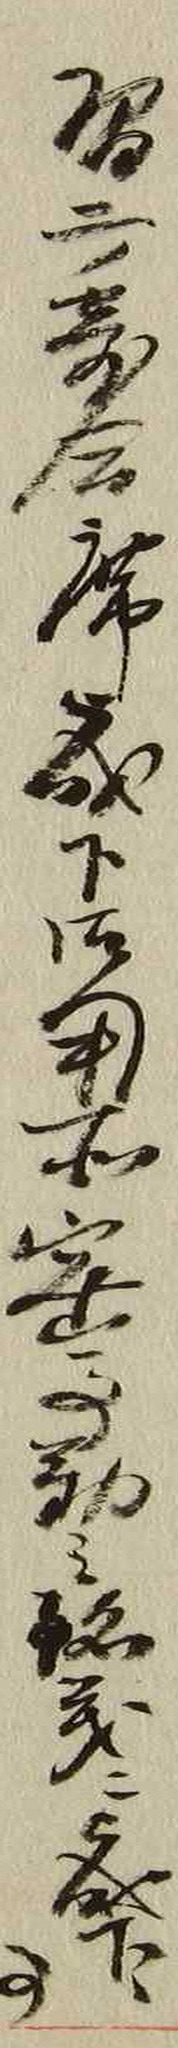習二寄合席被成下御用所密事勤之銘義被成下候事
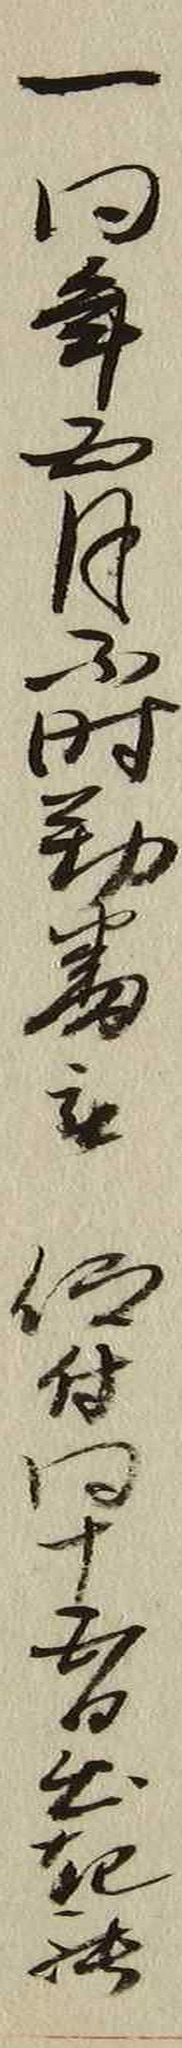一同年五月不時勤番被仰付同十五日出起罷
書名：諸士系譜　巻之350　せ之部1冊全
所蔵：会津若松市立会津図書館
